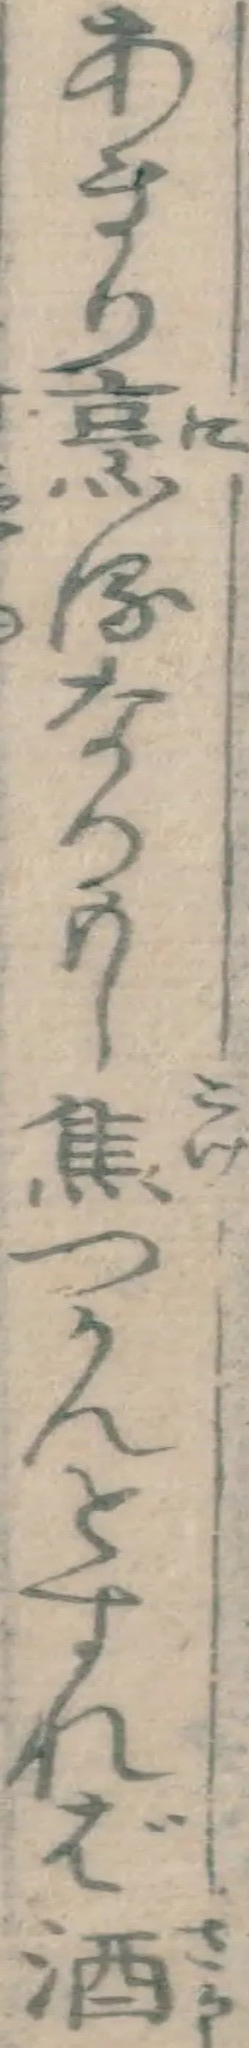あまり烹るなりもし焦つかんとすれば酒
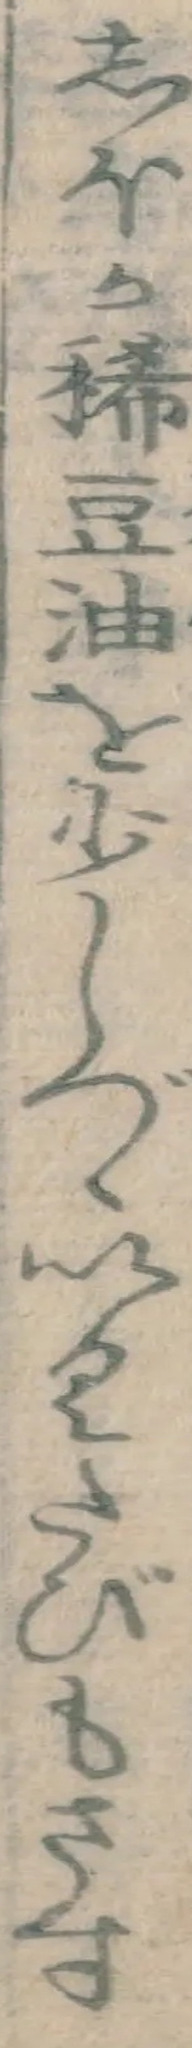しほか稀豆油を少しづゝいくたびもさす
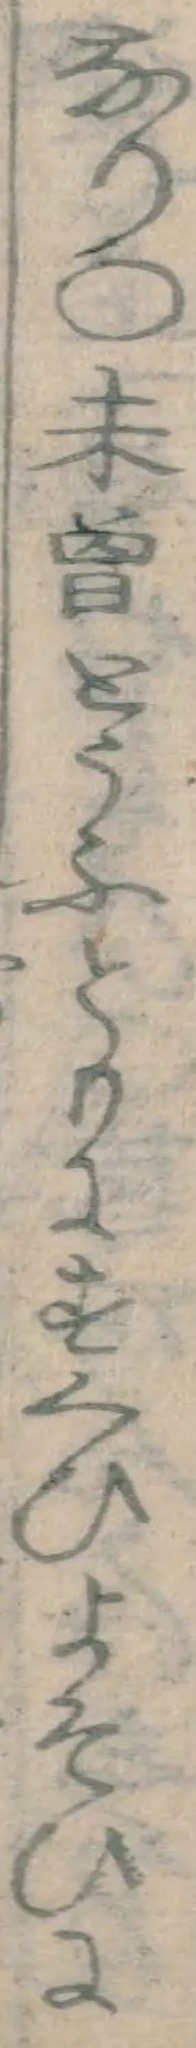なり○未曽とうふともにすくひよそひに
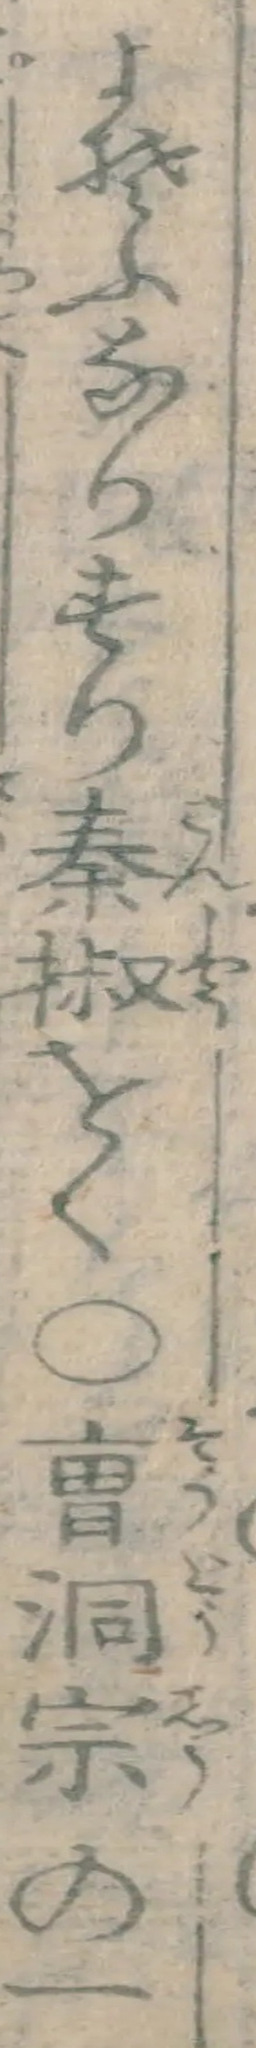よそふなりすり秦椒をく○曹洞宗の一
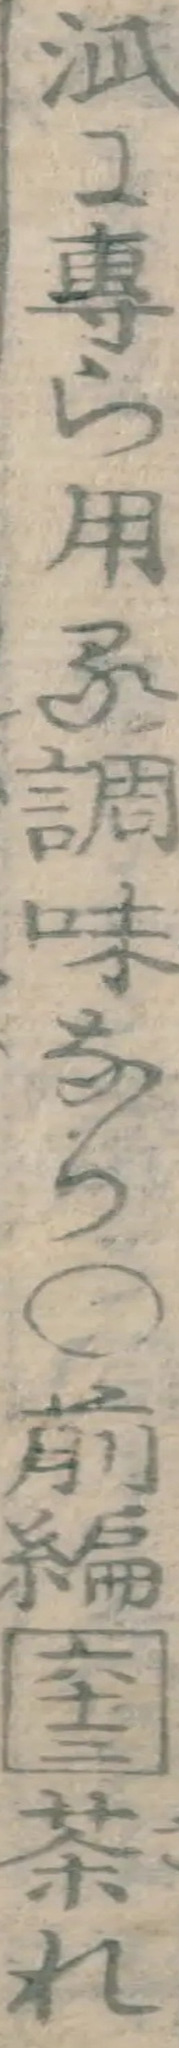派に専ら用る調味なり○前編六十三茶れ
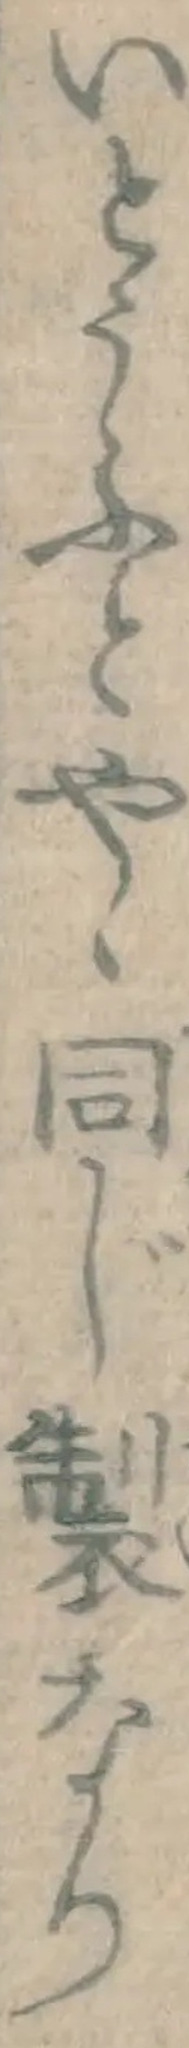いとうふとやゝ同じ製なり

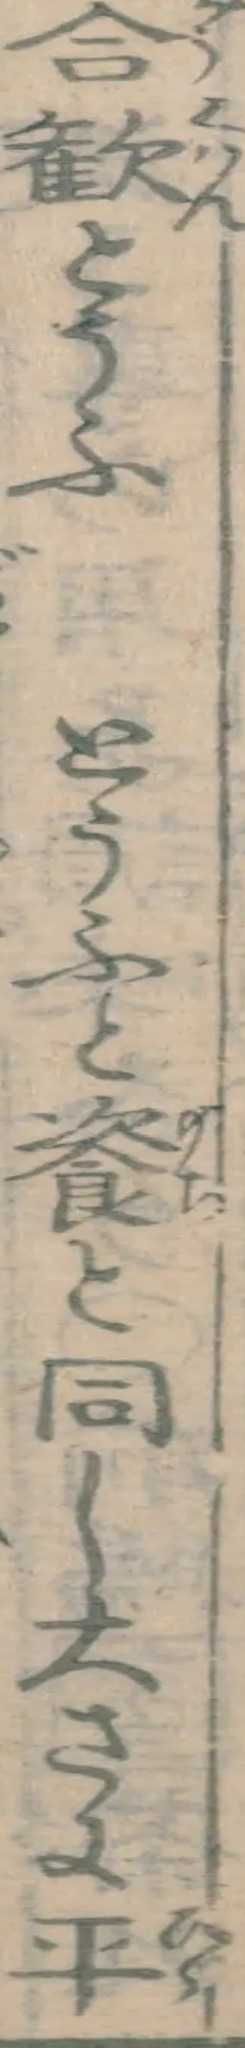八十一合歓とうふとうふと餈と同し大さに平
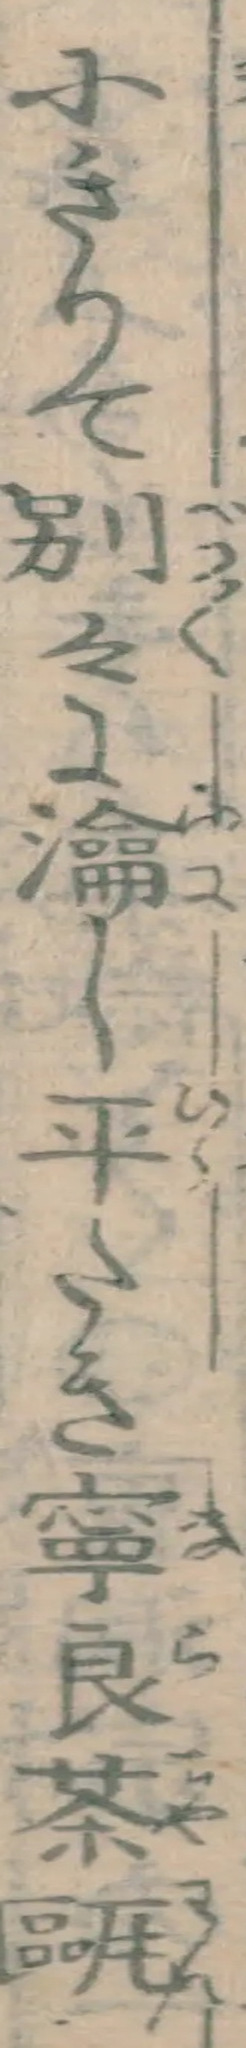にきりて別々に瀹し平たき寧良茶甌
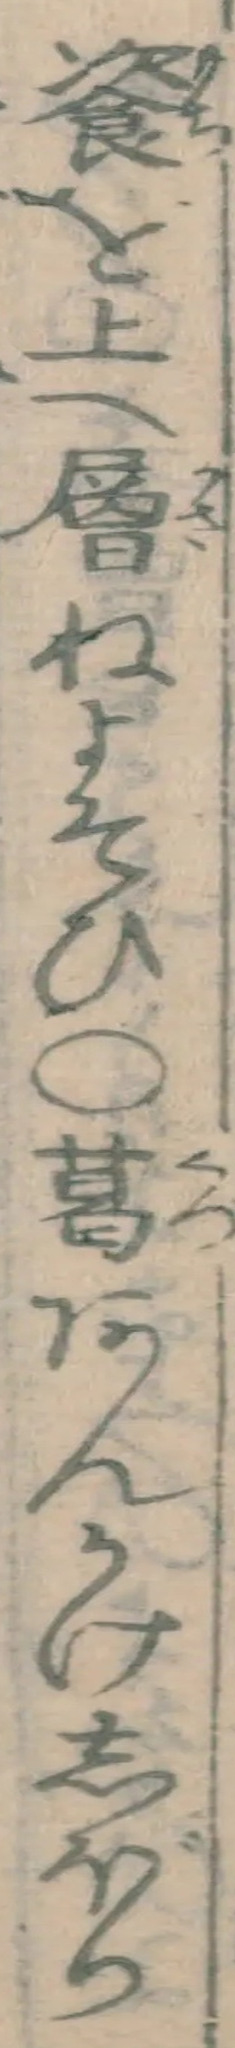餈を上へ層ねよそひ○葛あんかけしぼり
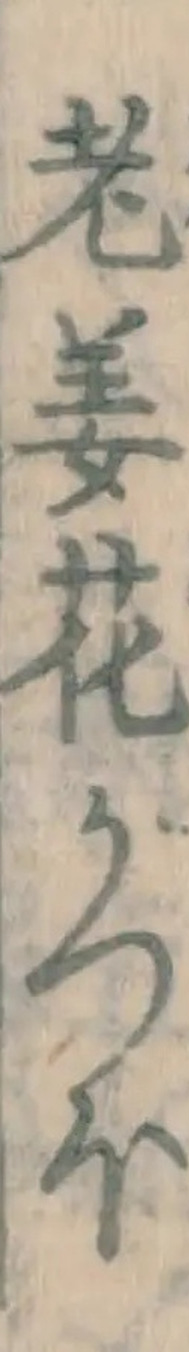老姜花かつほ
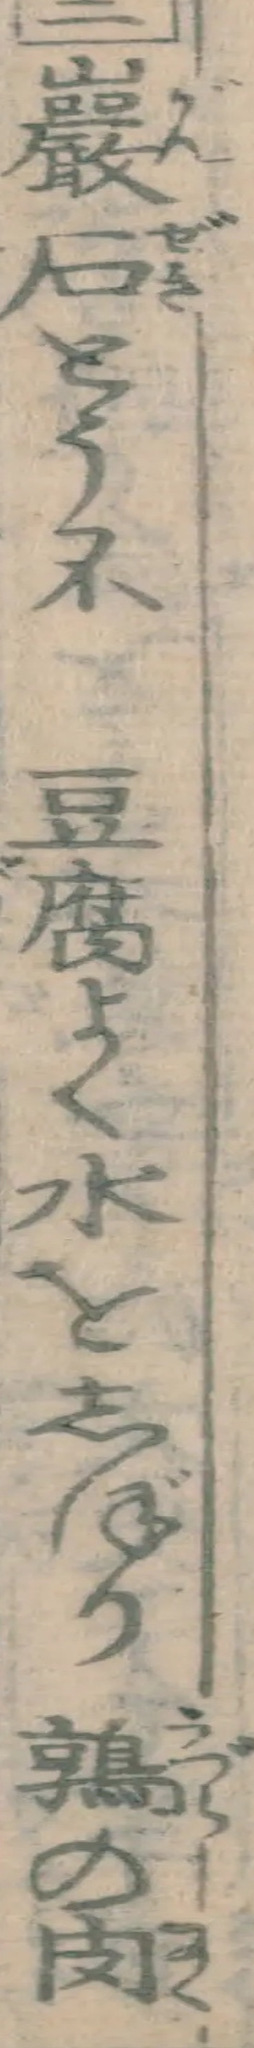八十二巌石とうふ豆腐よく水をしぼり鶉の肉
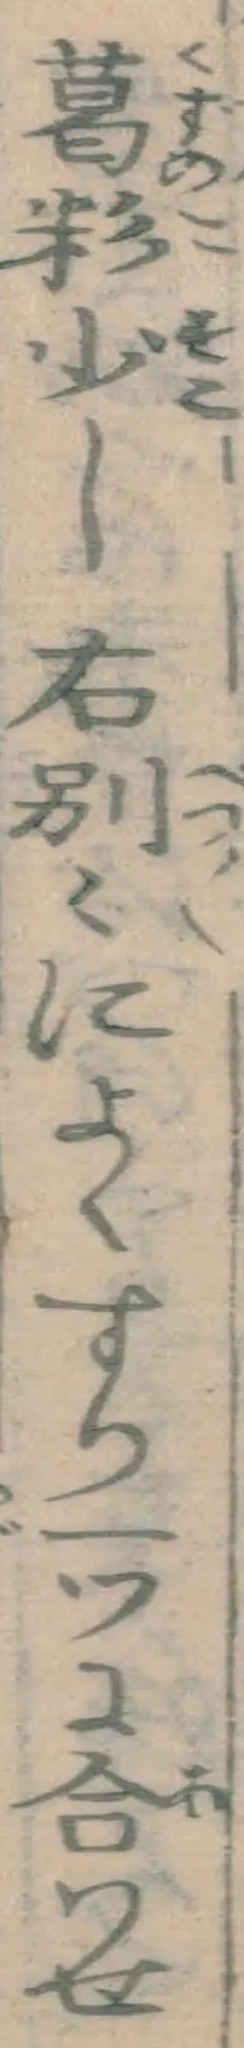葛粉少し右別々によくすり一つに合はせ
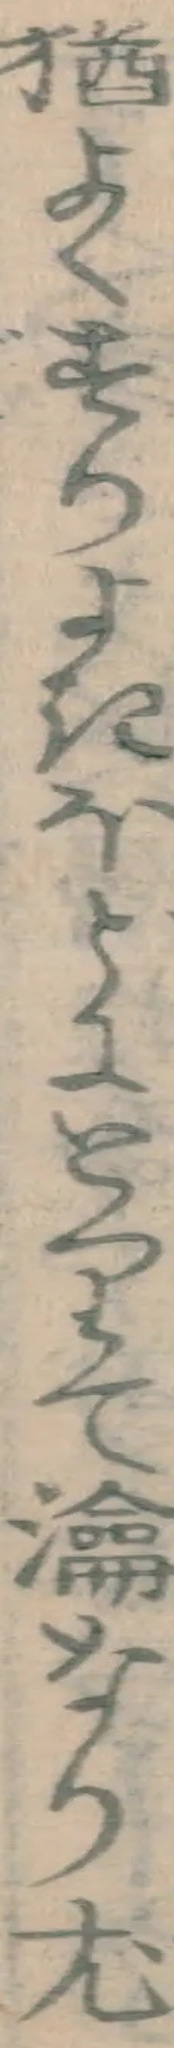猶よくすりよきほどにとりて瀹なり尤
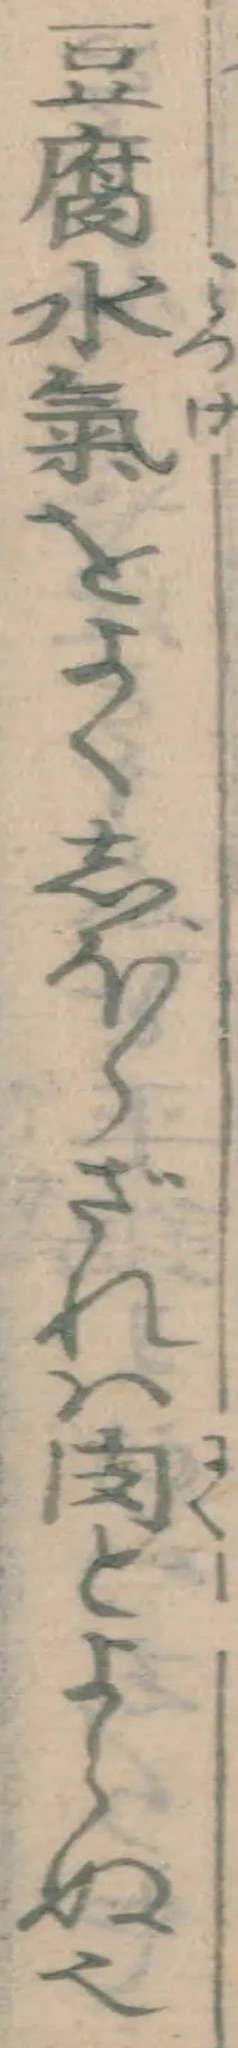豆腐水気をよくしぼらざれは肉とよらぬ也
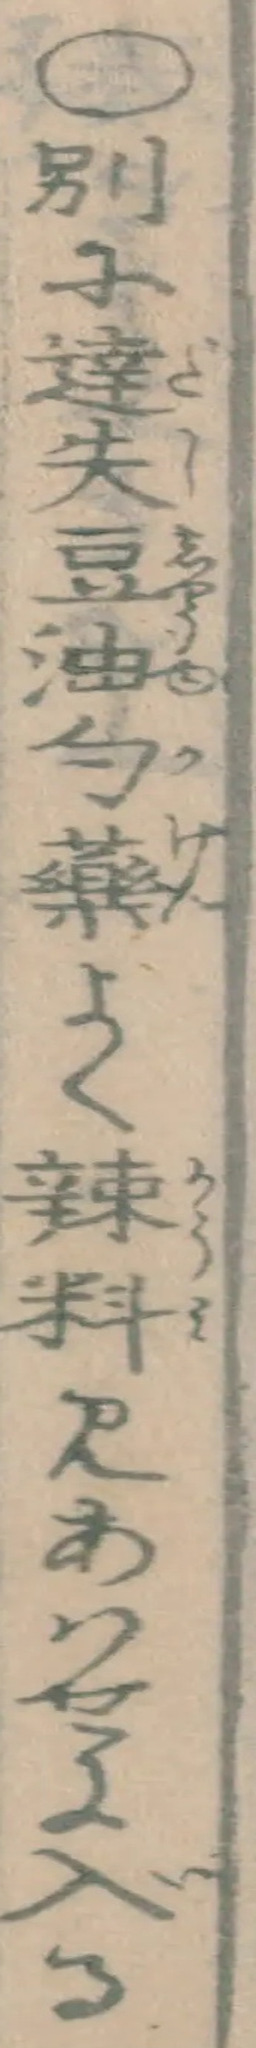○別に達失豆油勺薬よく辣料見あはせに入る
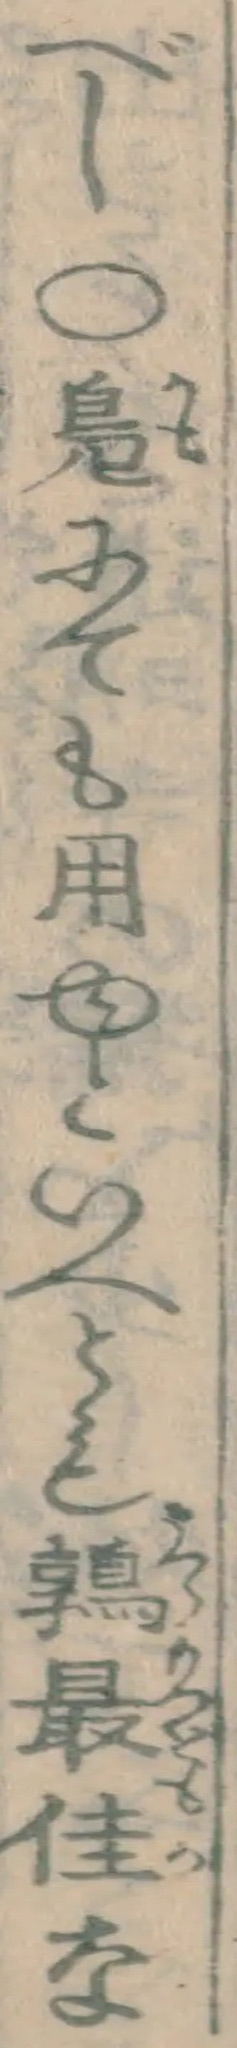べし○鳬にても用ゆといへとも鶉最佳な
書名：豆腐百珍. 続編
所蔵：国立国会図書館 National Diet Library, JAPAN
